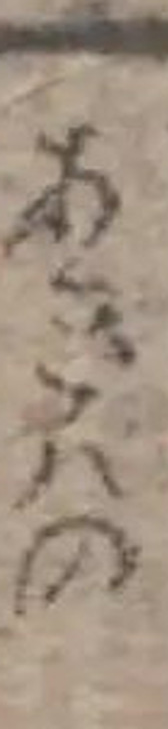あきはの
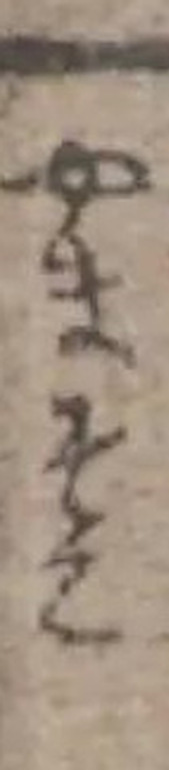やまそこ
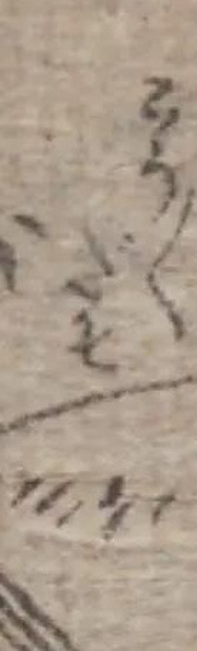こう〳〵
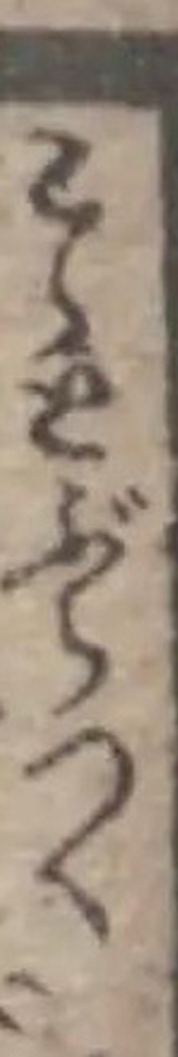こゝとぶらつく
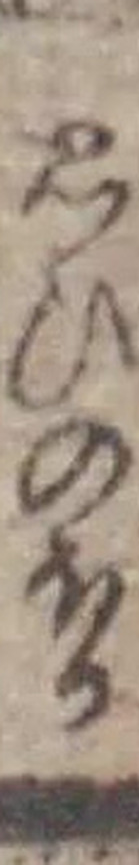思ひのほか
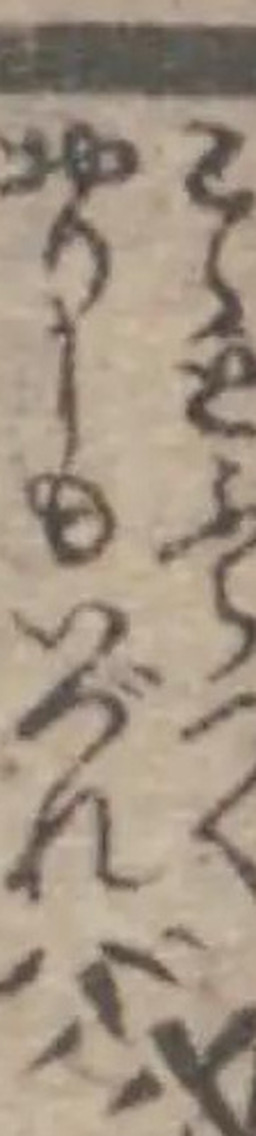おりしもいづれ
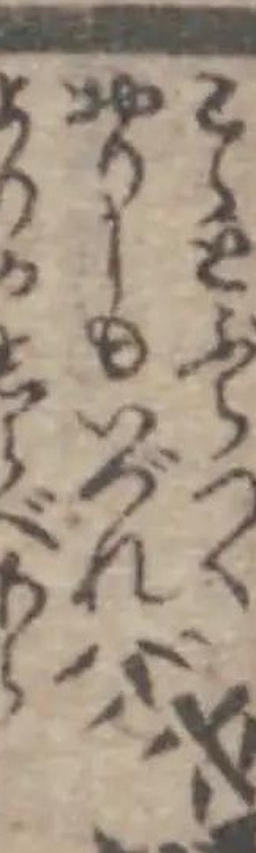おりしもいづれ
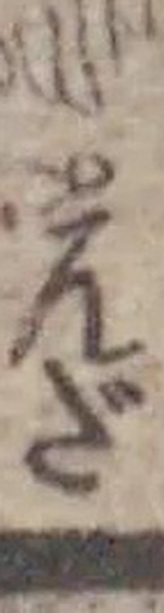とんだ
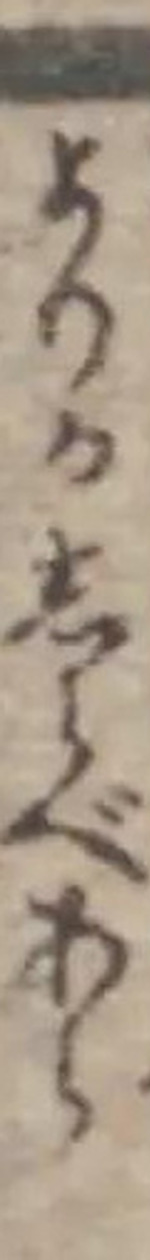よりかしらべあら
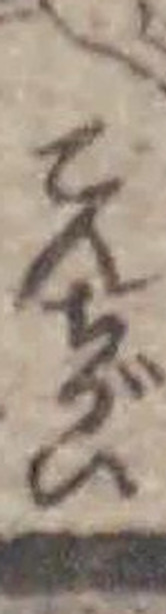てんちがい
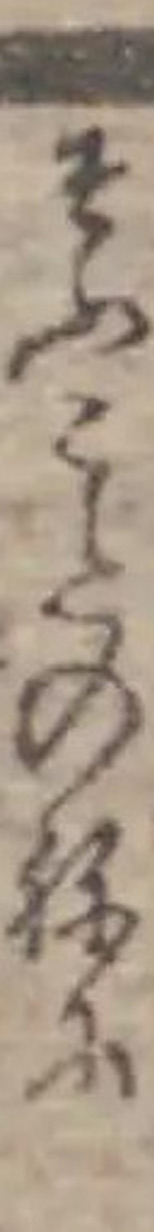そふことのねに
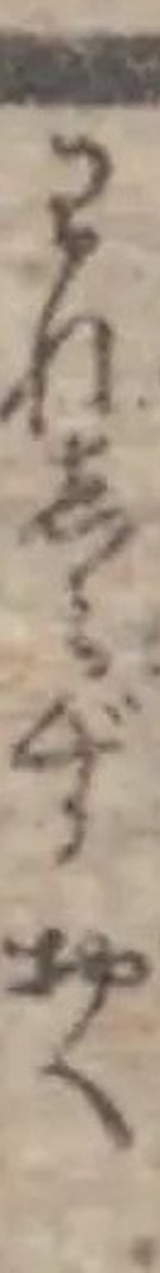われしらずおく
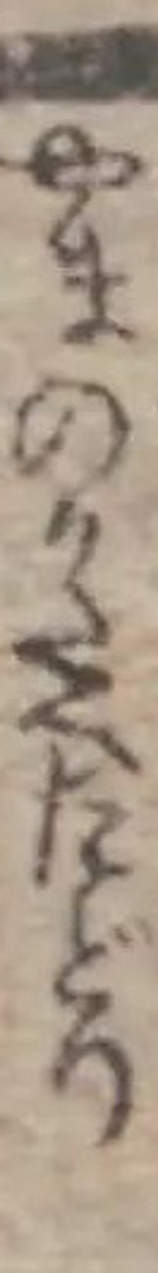やまのかたへたどり
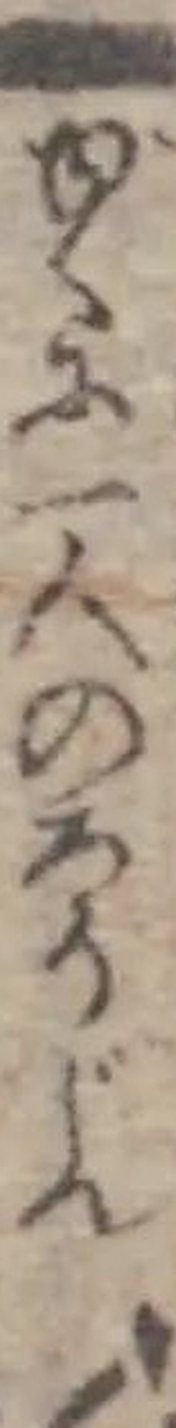ゆくに一人のろうじん
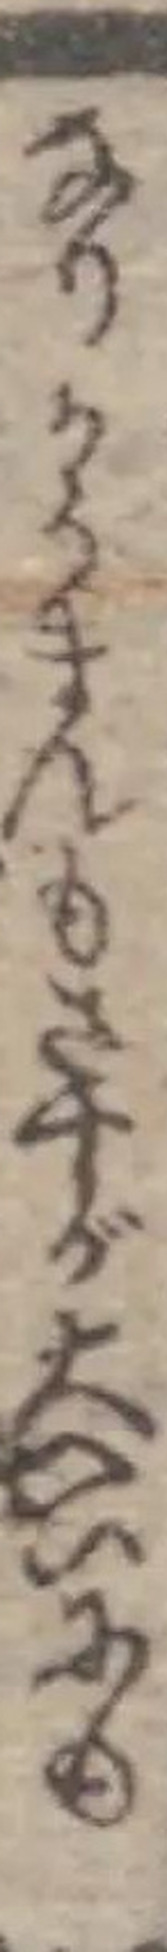なりかうまんもさすが大へいにも
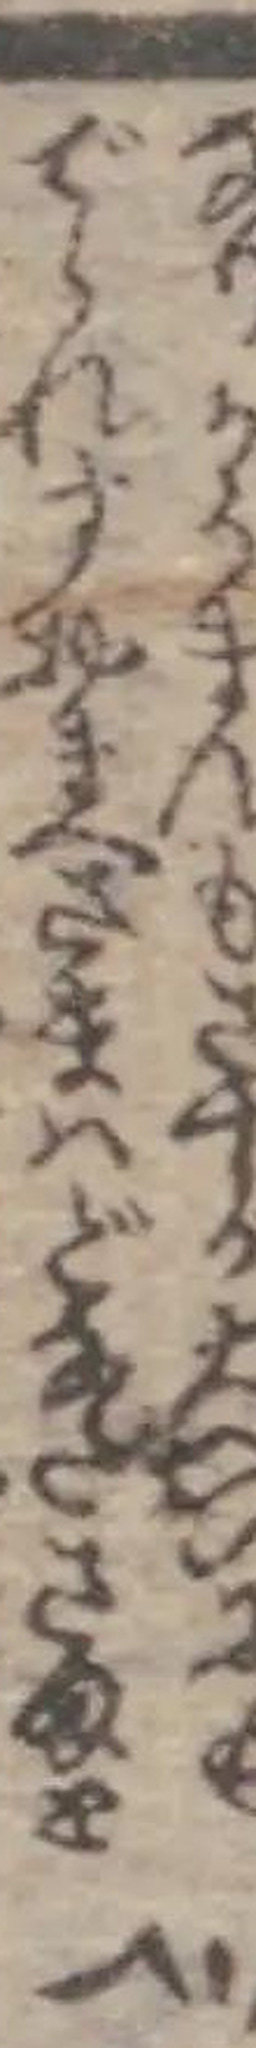でられずおまへさまはどなたさまと
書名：富多高慢噺 3巻
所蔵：国立国会図書館 National Diet Library, JAPAN
